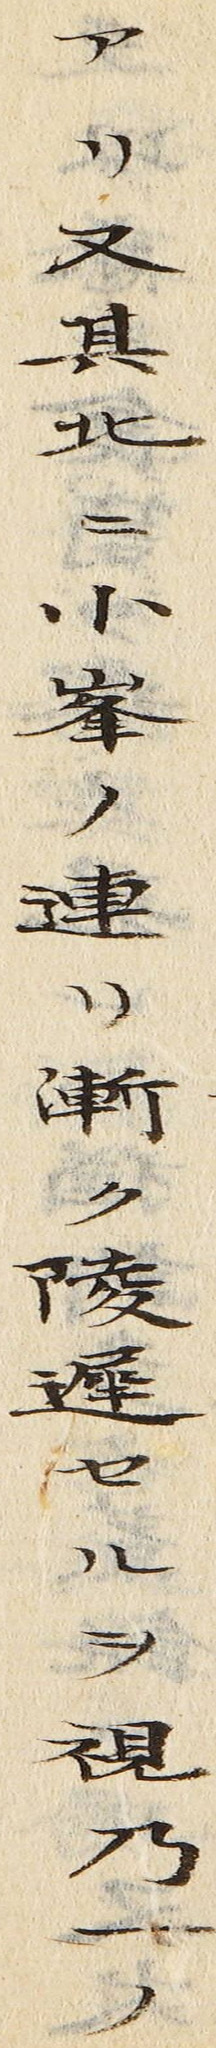アリ又其北ニ小峯ノ連リ漸ク陵遅セルヲ視乃一ノ
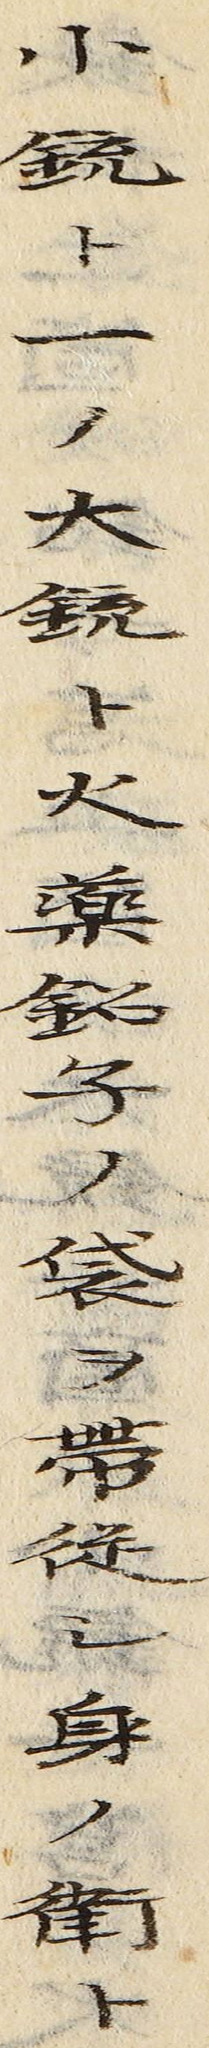小銃ト一ノ大銃と火薬鉛子ノ袋ヲ帯従シ身ノ衛ト
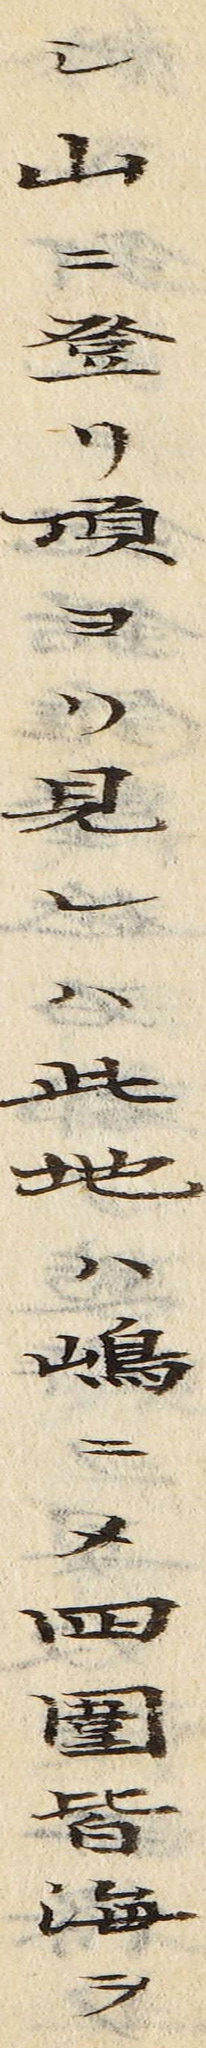シ山ニ登リ頂ヨリ見レハ此地ハ島ニシテ四囲皆海ヲ
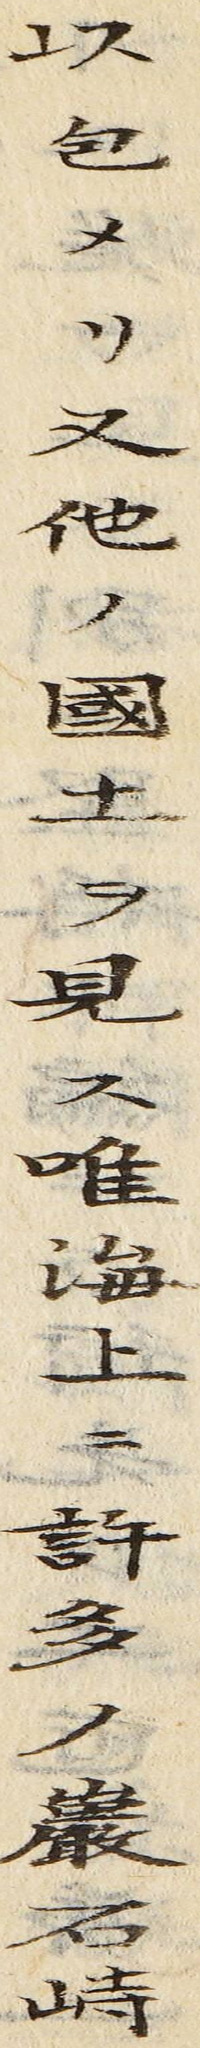以包メリ又他ノ国土ヲ見ス唯海上ニ許多ノ巌石峙
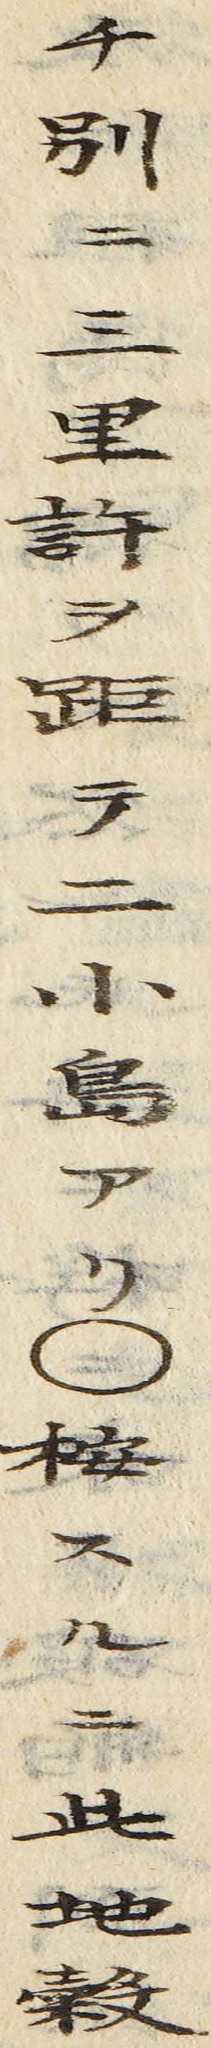チ別ニ三里許ヲ距テ二小島アリ◯按スルニ此地穀
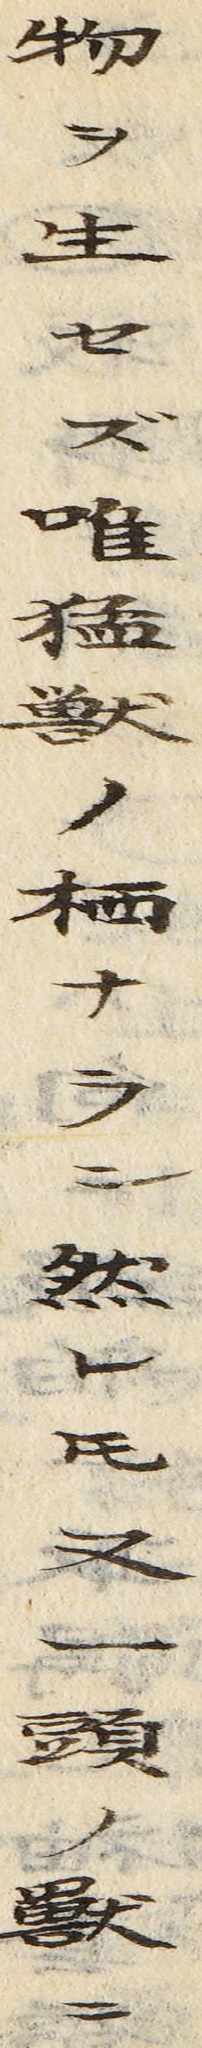物ヲ生セズ唯猛獣ノ栖ナラン然レトモ又一頭ノ獣ニ
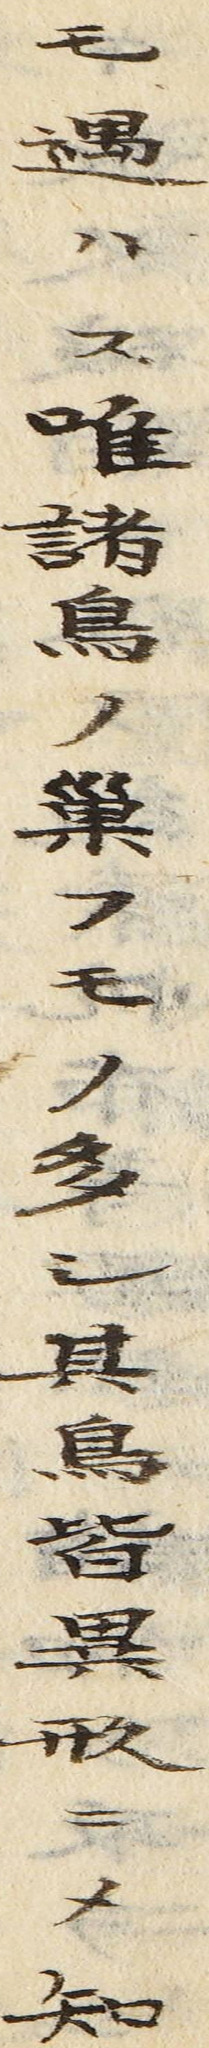モ遇ハス唯諸鳥ノ巣フモノ多シ其鳥皆異形ニシテ知
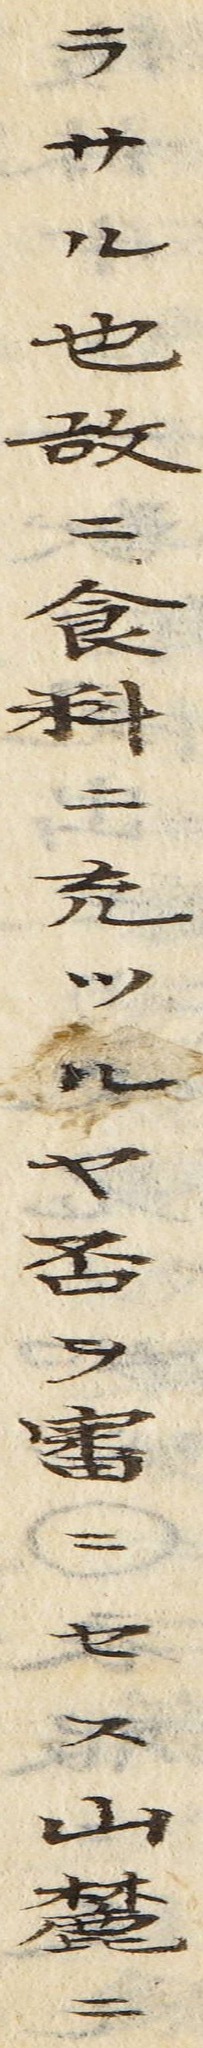ラサル也故ニ食料ニ充ツルヤ否ヲ審ニセス山麓ニ
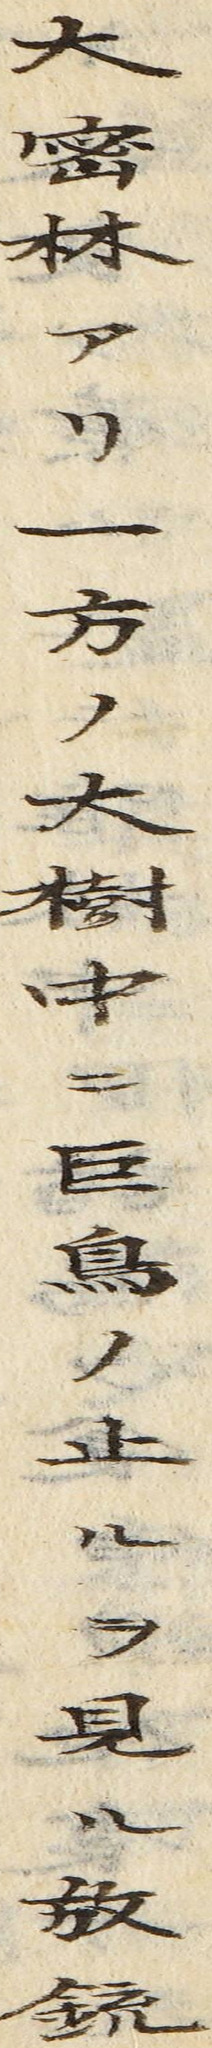大密林アリ一方ノ大樹中ニ巨鳥ノ止ルヲ見ル放銃
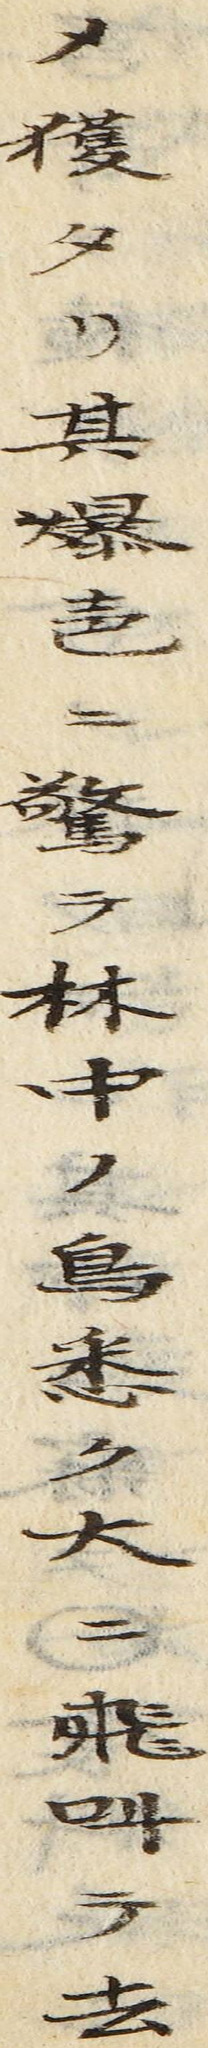シテ獲タリ其爆声ニ驚テ林中ノ鳥悉ク大ニ飛叫テ去
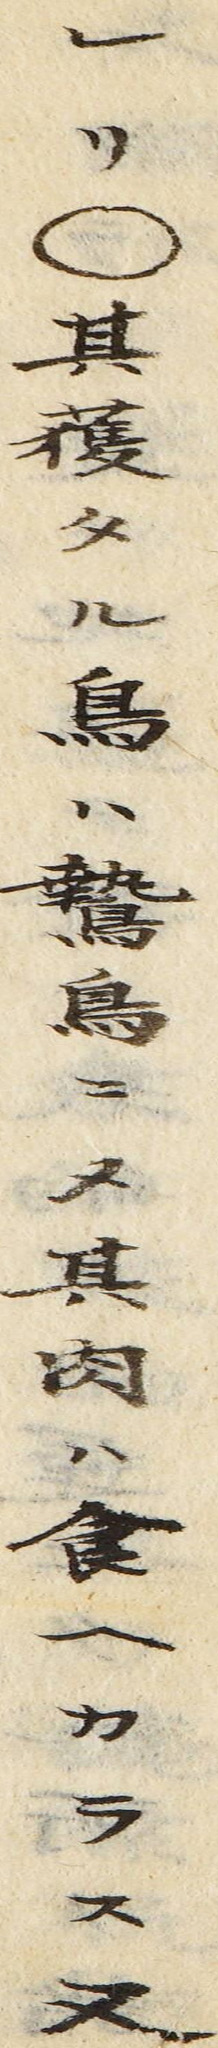レリ◯其獲タル鳥ハ鷙鳥ニシテ其肉ハ食ヘカラス又
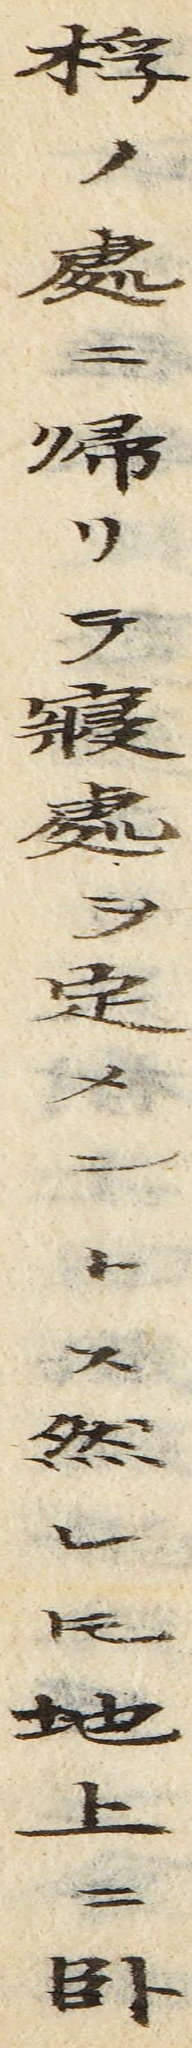桴ノ処ニ帰リテ寝処ヲ定メントス然レトモ地上ニ臥

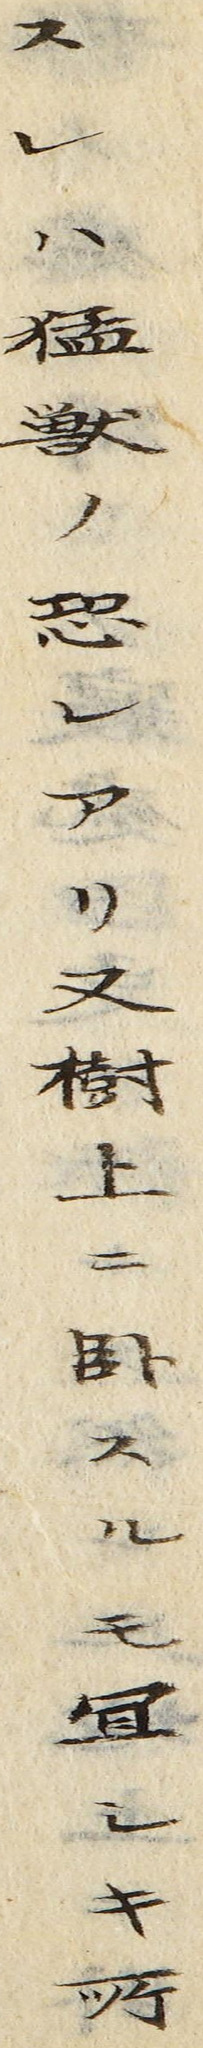スレハ猛獣ノ恐レアリ又樹上ニ臥スルモ宜シキ所
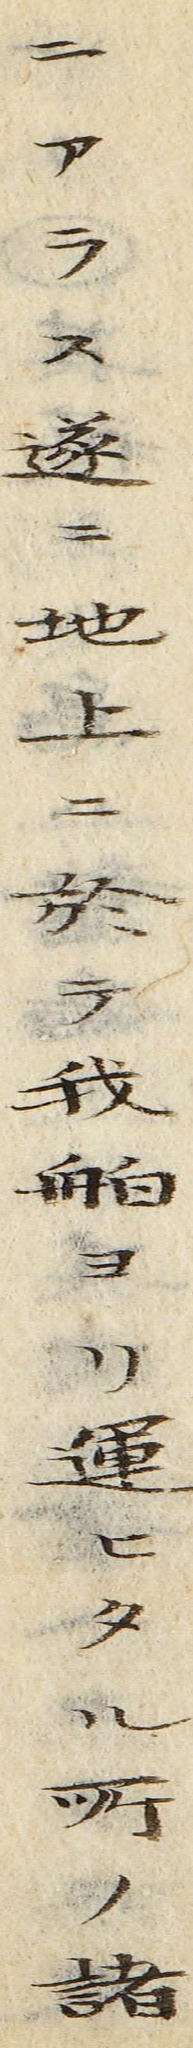ニアラス遂ニ地上ニ於テ我舶ヨリ運ヒタル所ノ諸
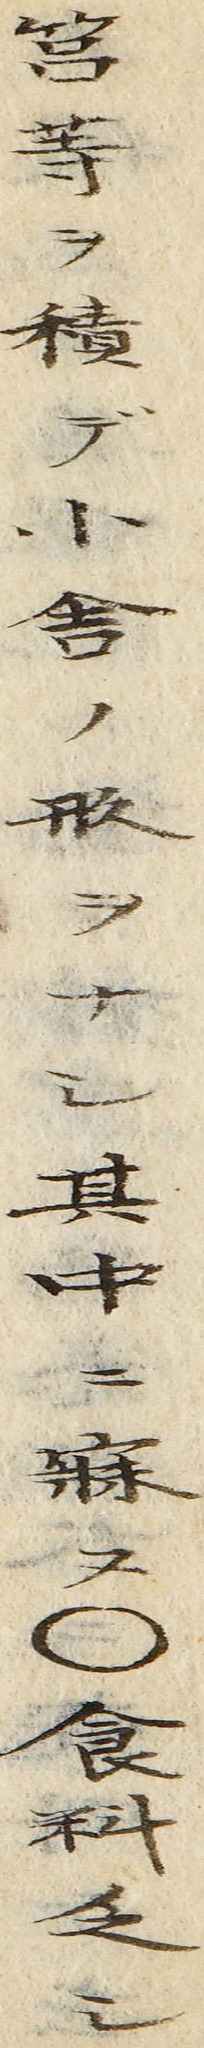筥等ヲ積デ小舎ノ形ヲナシ其中ニ寐ヌ◯食料乏シ
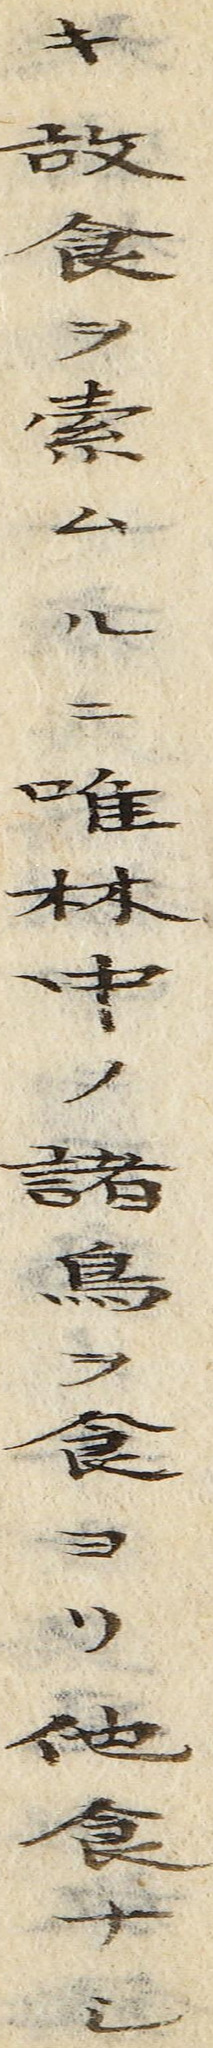キ故食ヲ索ムルニ唯林中ノ諸鳥ヲ食ヨリ他食ナシ
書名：漂流紀事
